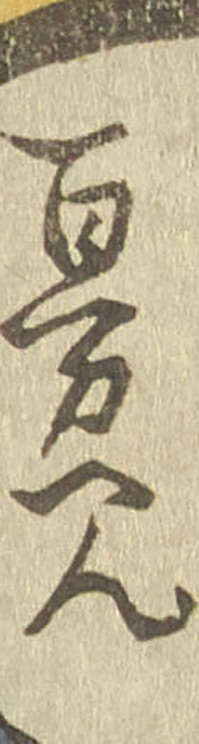百万へん
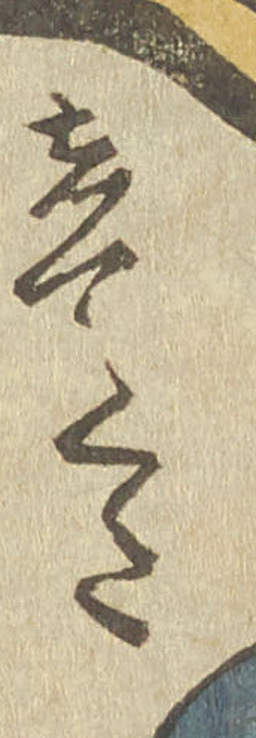してくた
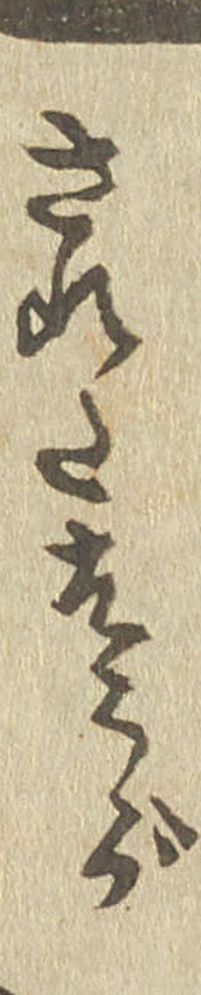されたはうが
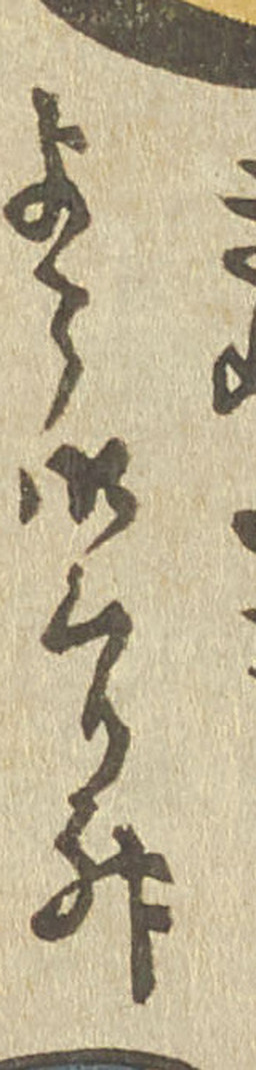よう御上り升
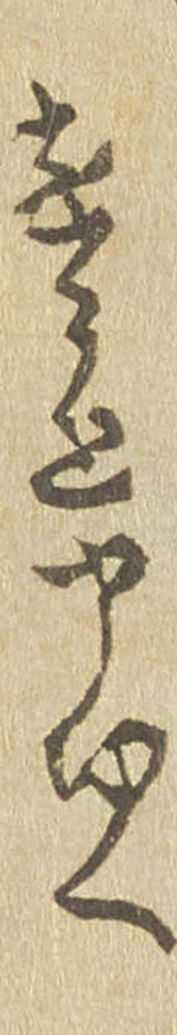をうと申ゆへ
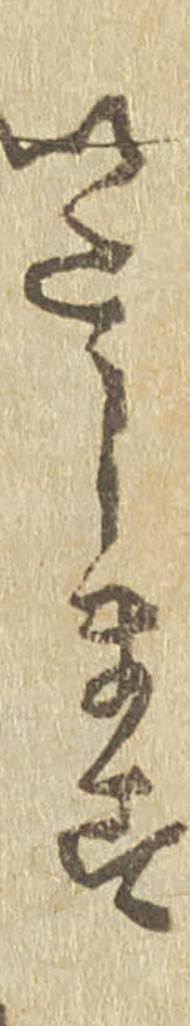いたします
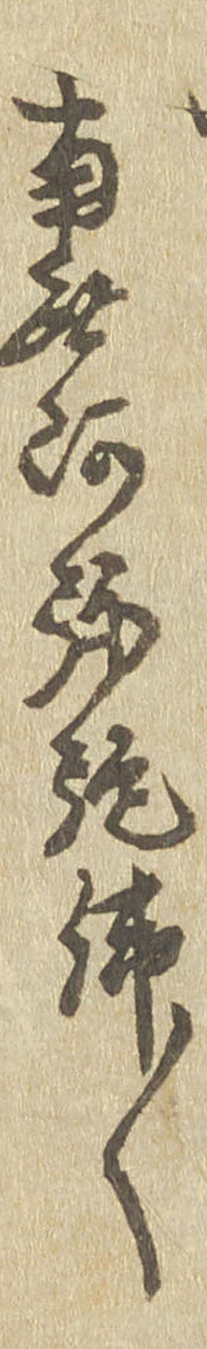南無阿弥陀仏＼
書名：[じしん百万遍]
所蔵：東京大学総合図書館 General Library in the University of Tokyo, JAPAN
